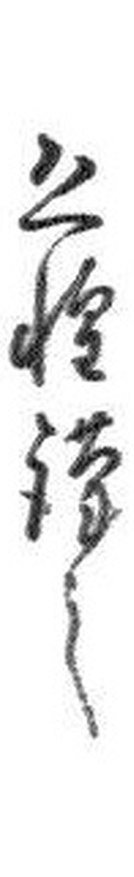恐惶謹言
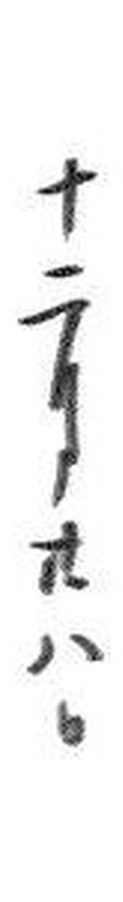十二月廿八日
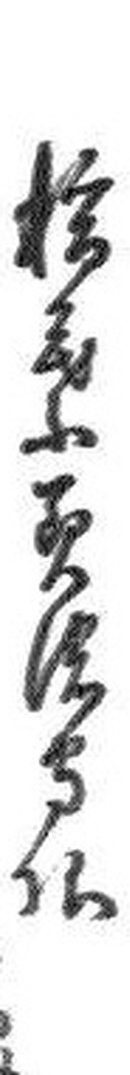稲葉美濃守様
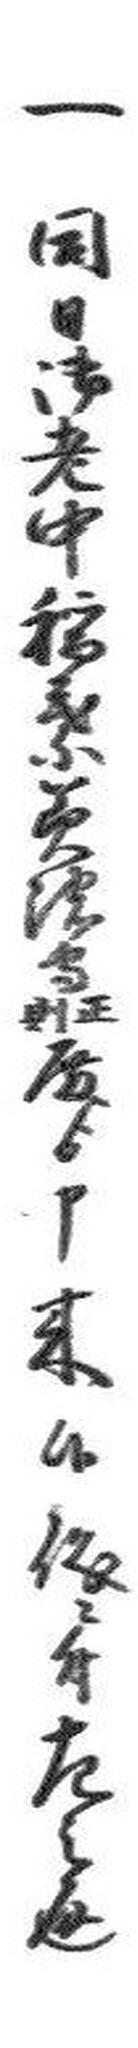一同日御老中稲葉美濃守正則殿ゟ申来候儀ニ付左之通
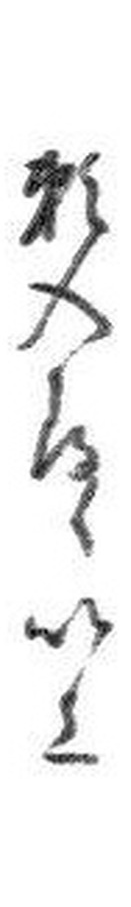頼入存候以上

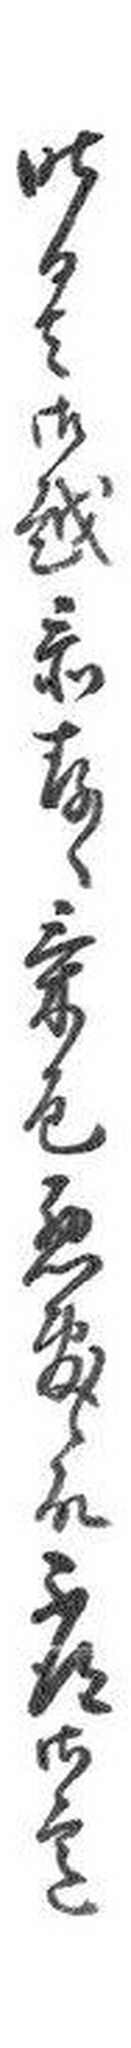昨日者御越忝存候気色悪敷候故不得御意
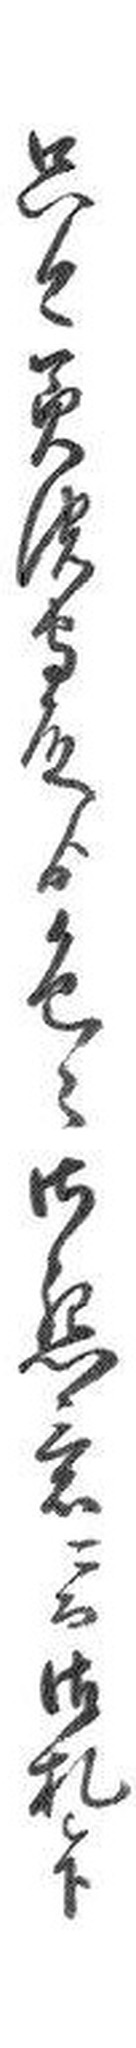只今美濃守殿ゟ色々御懇意ニ而御札被下
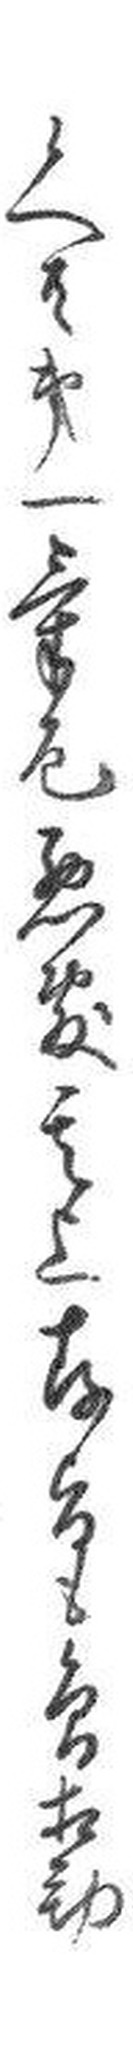候ヘ共第一気色悪敷其上存旨も候間相勤
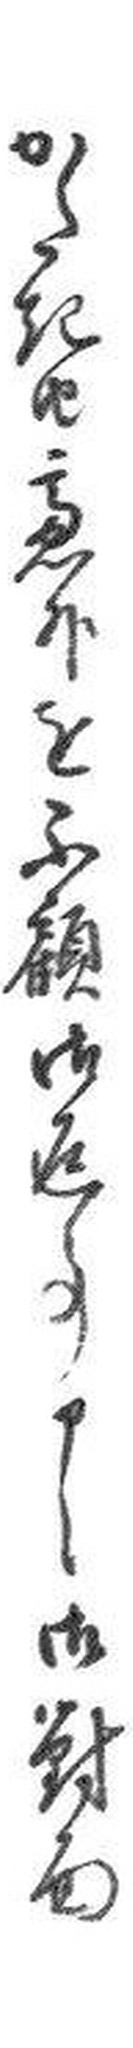かたき由慮外を不顧御返事申候御対面
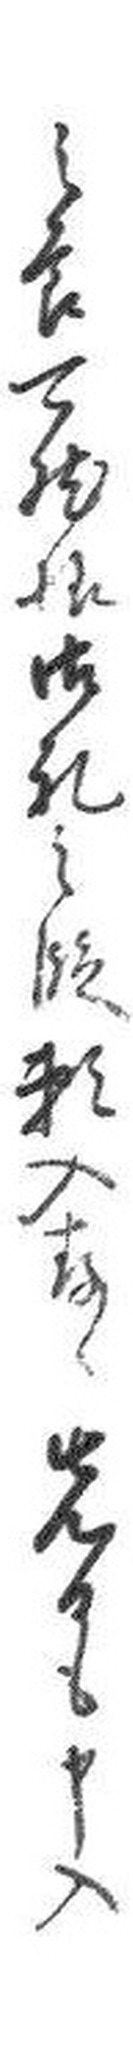之節可然様御礼之段頼入存候先日も申入
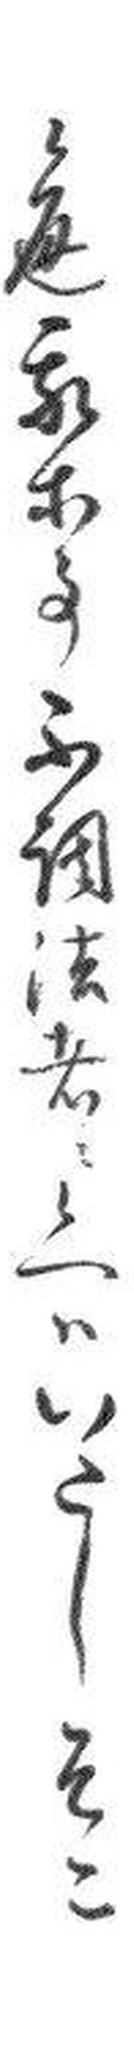候通我等事不調法者ニ候ヘハいたしそこ
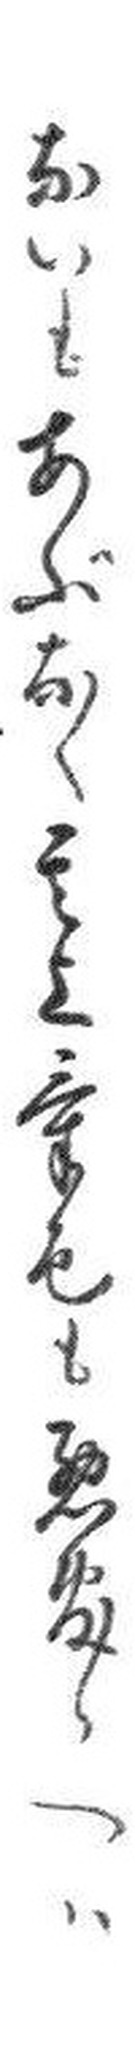ないもあぶなく其上気色も悪敷候ヘハ
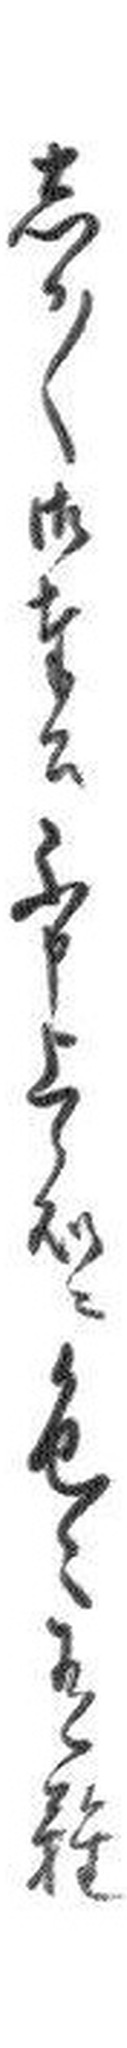しか〳〵御奉公不申上候処ニ色々有難
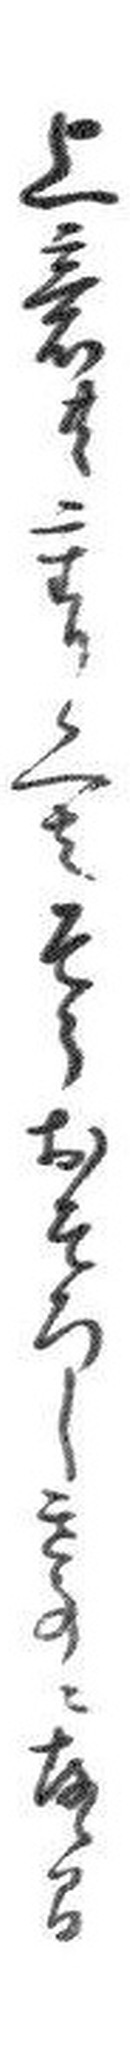上意共重り候ヘ者そらおそろしき事ニ存候間
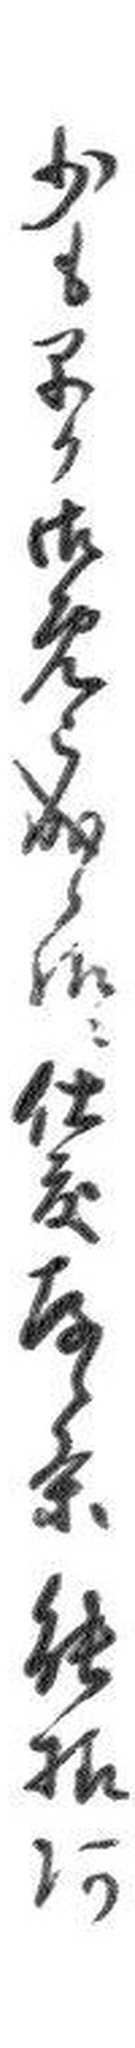少も早ク御免被成候様ニ仕度存候条能様阿
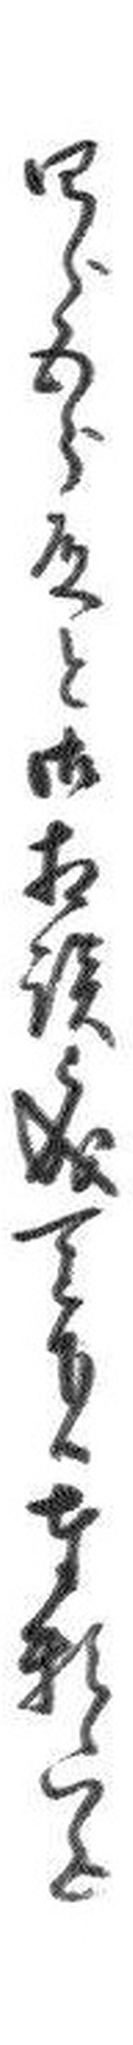四郎五郎殿と御相談被成可被下候奉頼候奉頼候以上
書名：家譜 十一 昌親公 従延宝二年到延宝四年八月
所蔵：福井県文書館 Fukui Prefectural Archives
